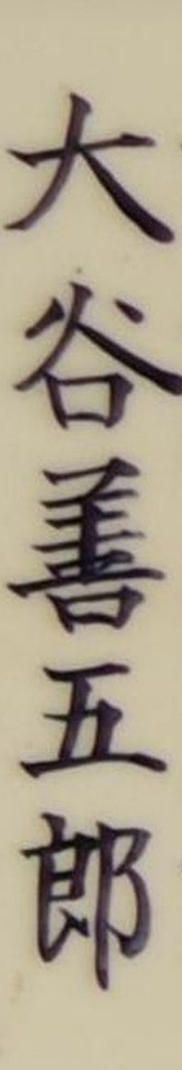大谷善五郎
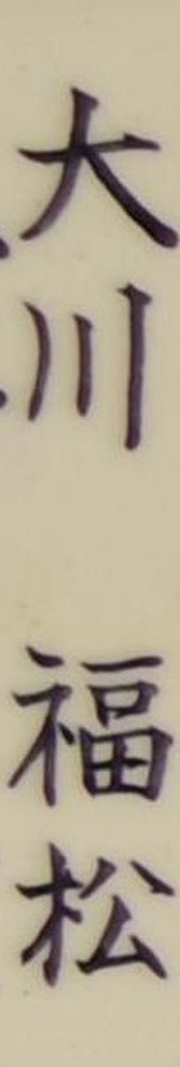大川福松
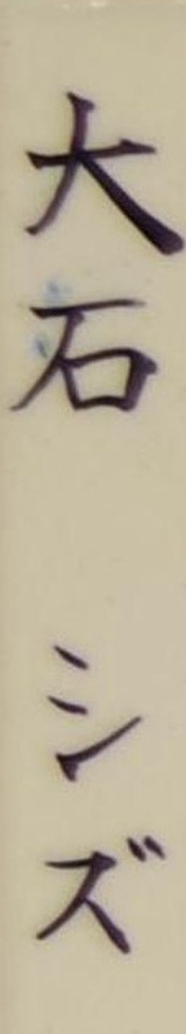大石シズ

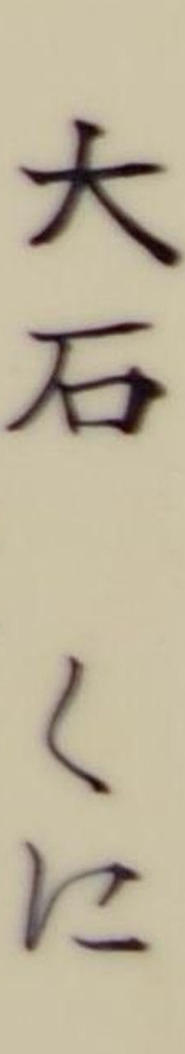大石くに
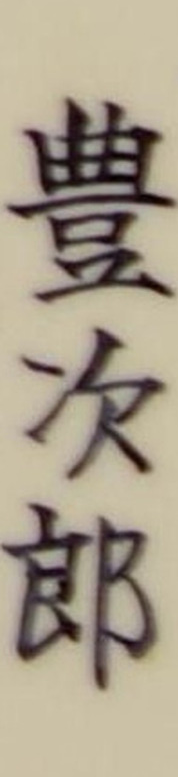豊次郎
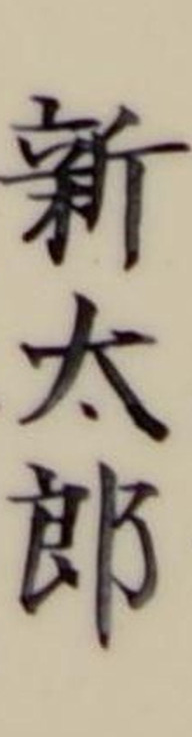新太郎
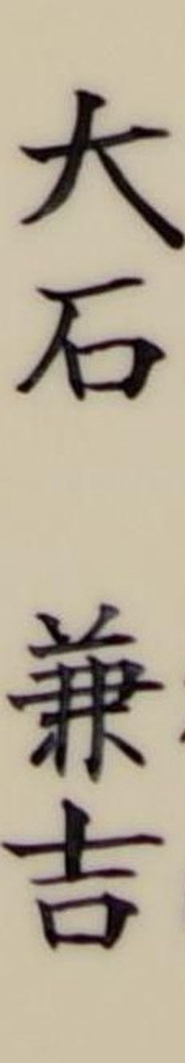大石兼吉
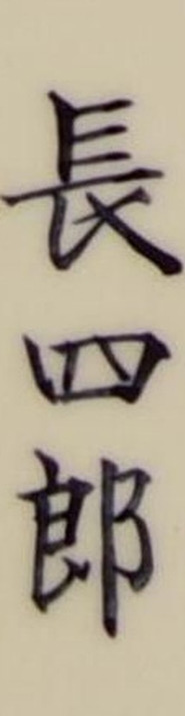長四郎
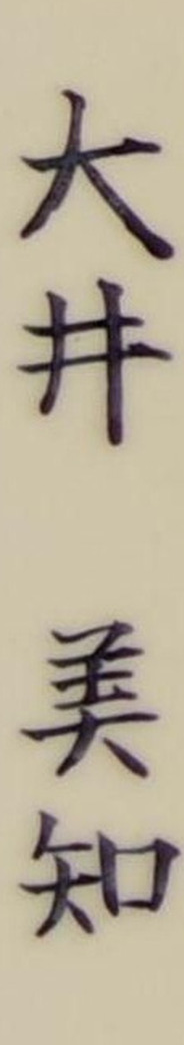大井美知
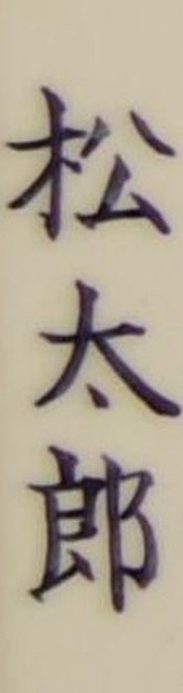松太郎

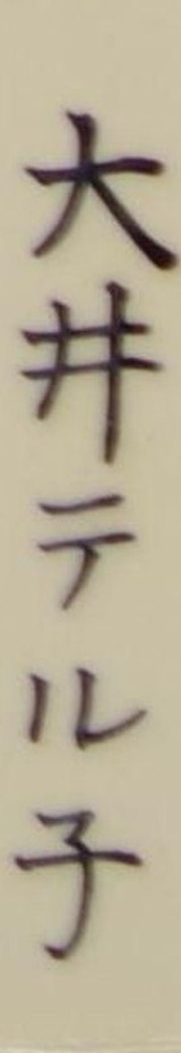大井テル子
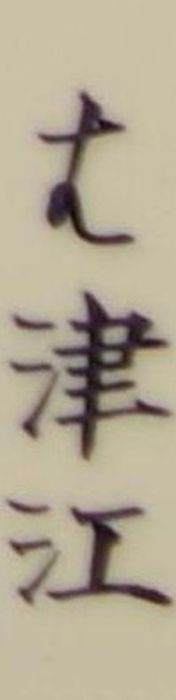はつ江
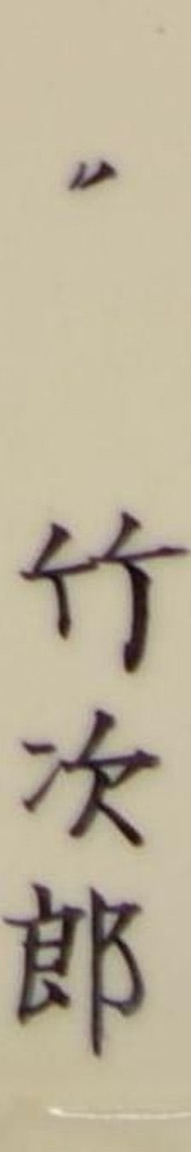竹次郎
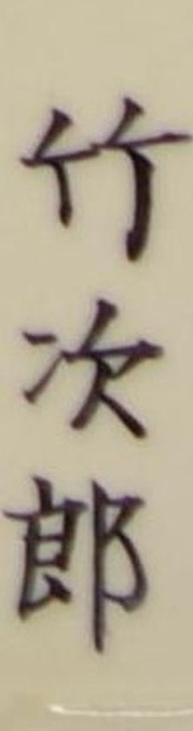竹次郎
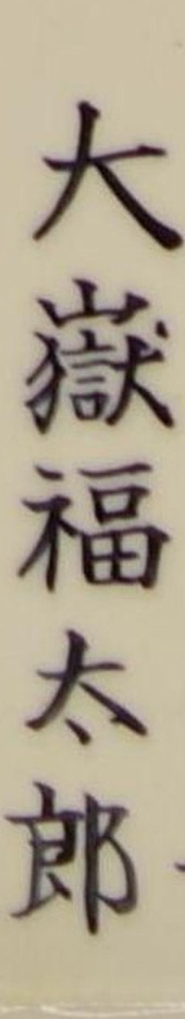大嶽福太郎
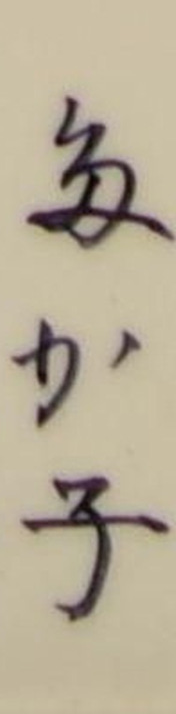たか子
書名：E~L
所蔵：高野山金剛峯寺
